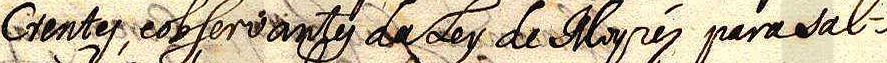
Crentes, e observantes da Ley de Moyzés para sal
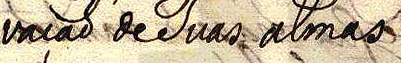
vaçaõ de suas almas
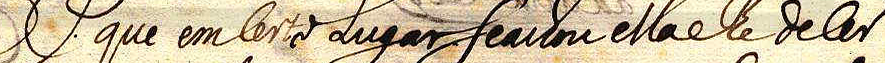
P. que em certo Lugar se achou ella Re de cer
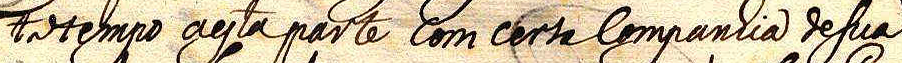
to tempo a esta com certa companhia de sua
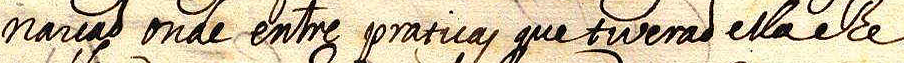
nasçaõ onde entre praticas que tiveraõ ella Re
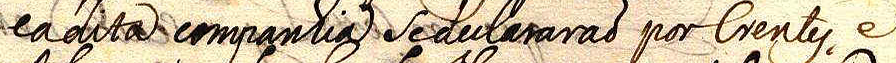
e a dita companhia se declararaõ por Crentes, e
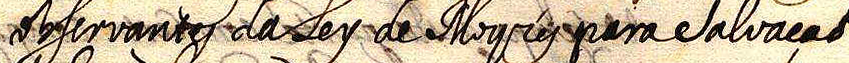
observantes da Ley de Moyzés para salvaçaõ
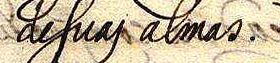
de suas almas.
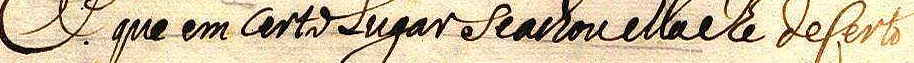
P. que em certo Lugar se achou ella Re de Certo
